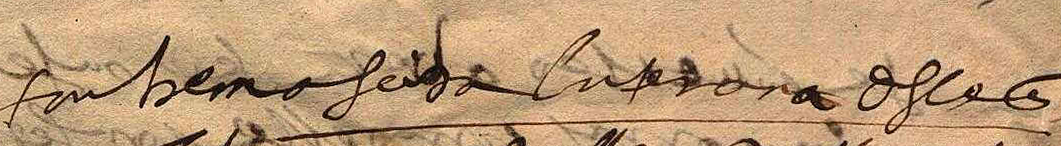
tambem a seita luterana disse q̄
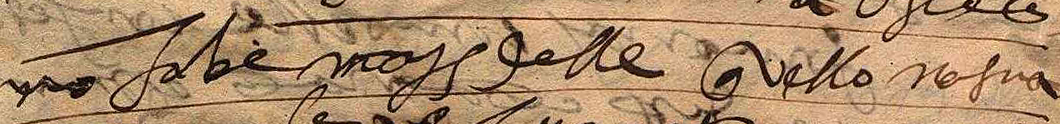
nō sabe majs delle q̄ vello na sua
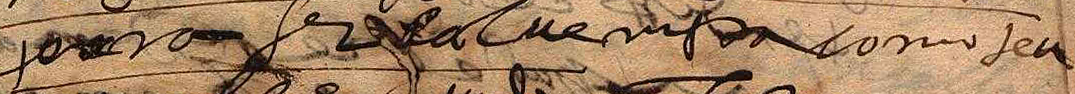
terra ser caluenista como seu
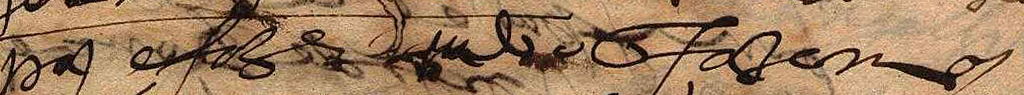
paj e fazer tudo o q̄ fazem os
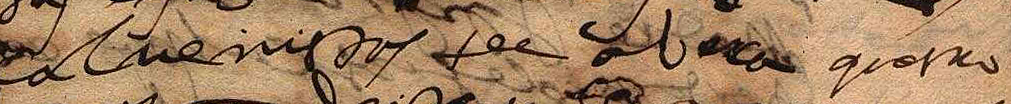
caluenistas tee avera quatro
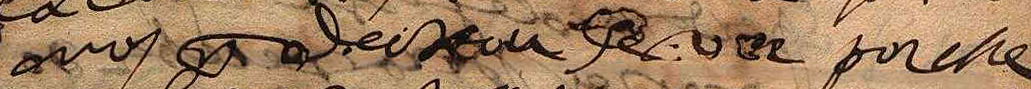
anos q̄ deixara de o ver por elle
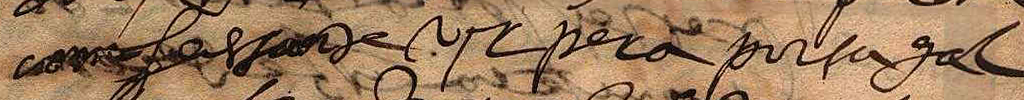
comfessante vjr pera portugal
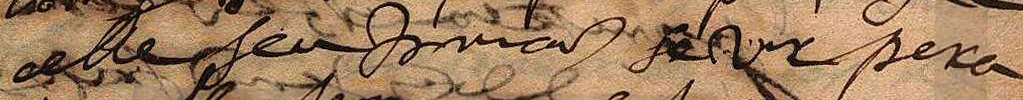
e elle seu Jrmaõ se vir pera
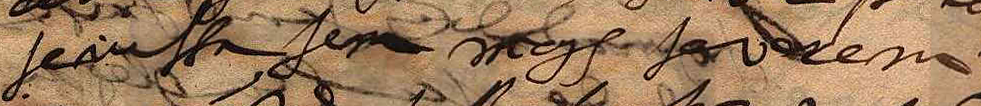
seuilha sem majs se verem
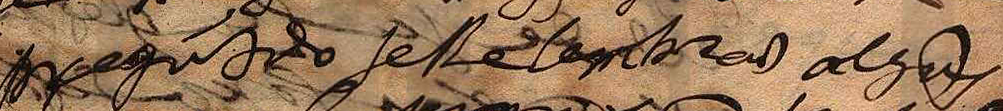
pregūtado se lhe lembraõ algūs
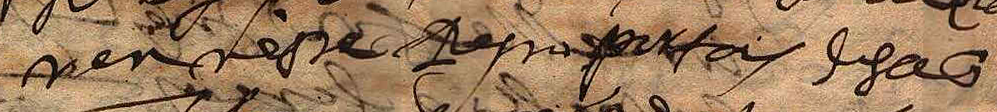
rem neste Rejno por tais disse q̄
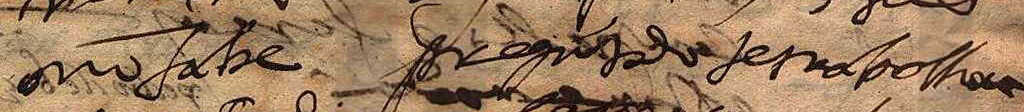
nō sabe pregūtado se trabalhou
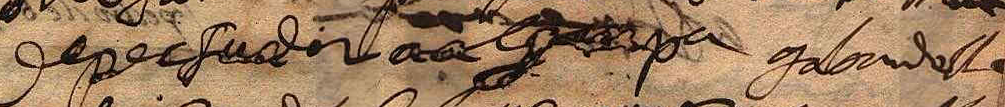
de persuadir a algua pa gabandolhe
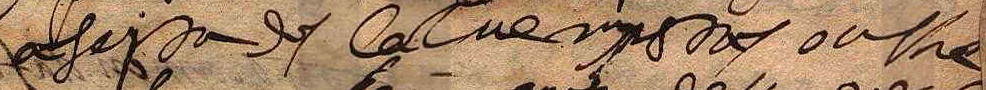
a sejta dos Caluenystas ou lhe
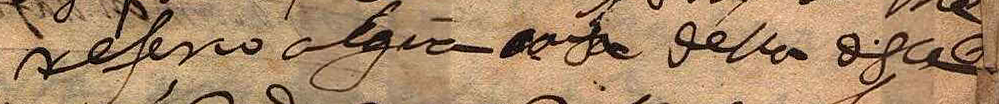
referio algūa cousa della disse q̄
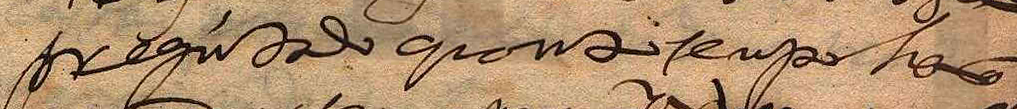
pregūtado quanto tenpo ha q̄
